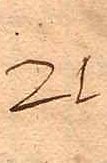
21
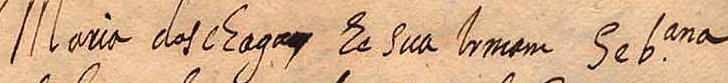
Maria das chagas he sua Irmam Seb.ana
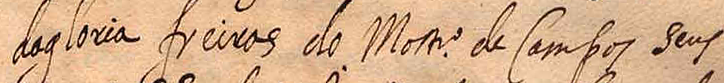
da gloria freiras do Mostr.o de Campos seus
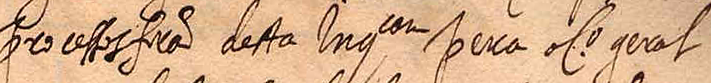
processos foraõ desta Inqcam pera o C.o geral
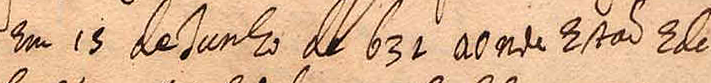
Em 15 de Iunho de 631 aonde Estaõ E de
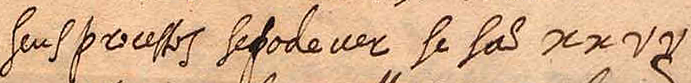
seus processos se pode uer se saõ xx vv
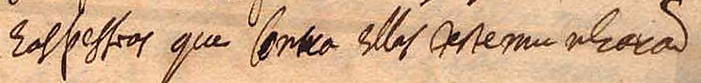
E as pessoas que Contra Ellas testemunharaõ
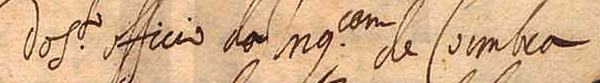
do s.to officio da Inq.cam de Coimbra
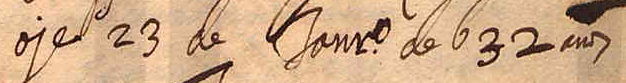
oje 23 de Janr.o de 632 anos
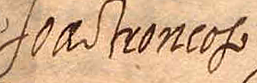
Joaõ troncoso
